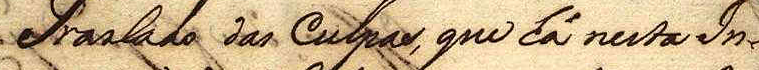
Traslado das Culpas, que há nesta In
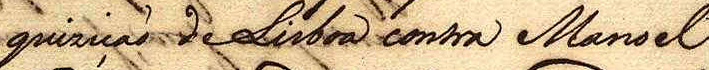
quiziçaõ de Lisboa contra Manoel
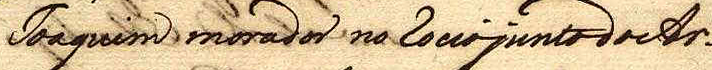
Ioaquim morador no Rocio junto do Ar
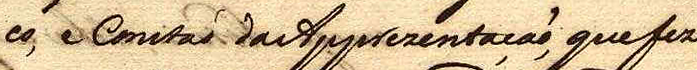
co, e Constaõ da Apprezentaçaõ, que fez
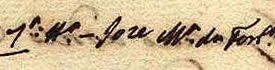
1.a tt.a - Ioze M.a da Fon.ca
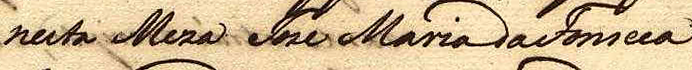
nesta Meza Ioze Maria da Fonseca
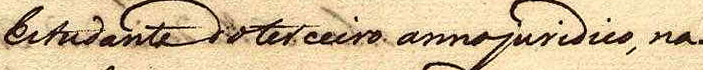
Estudante do terceiro anno juridico, na
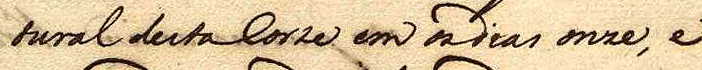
tural desta Corte em os dias onze, e
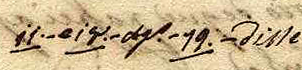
i1 e i8.- Ag.o -19.-disse.
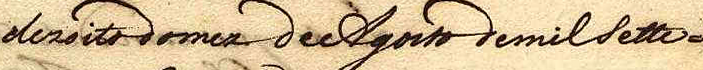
dezoito do mez de Agosto de mil Sette
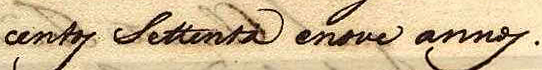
centos Settenta e nove annos.
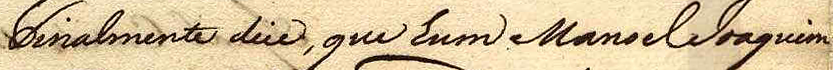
Finalmente dice, que hum Manoel Ioaquim
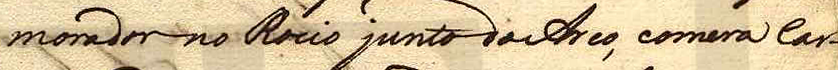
morador no Rocio junto do Arco, comera Car
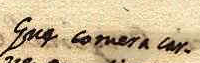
Que comera car
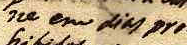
ne em dias pro
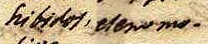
hibidos, e sem mo
